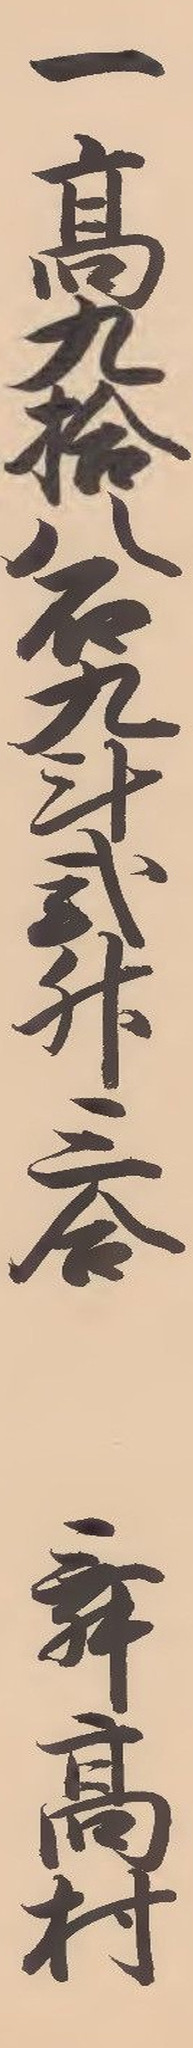一高九拾八石九斗弐升三合舞高村
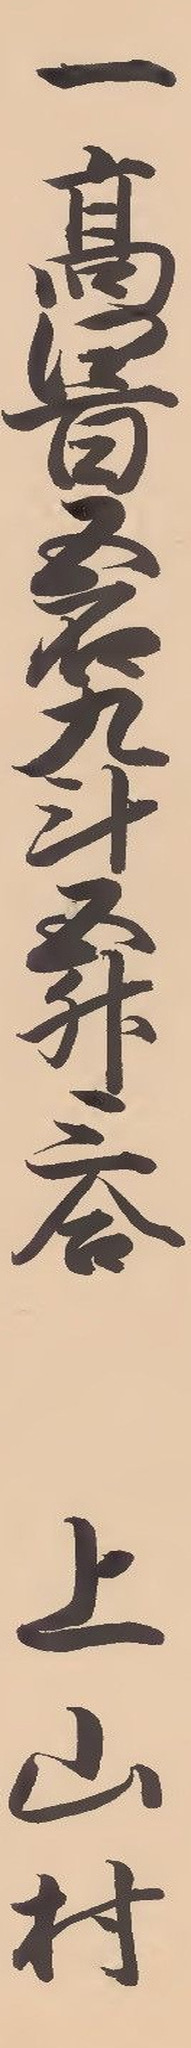一高四百五石九斗五升三合上山村
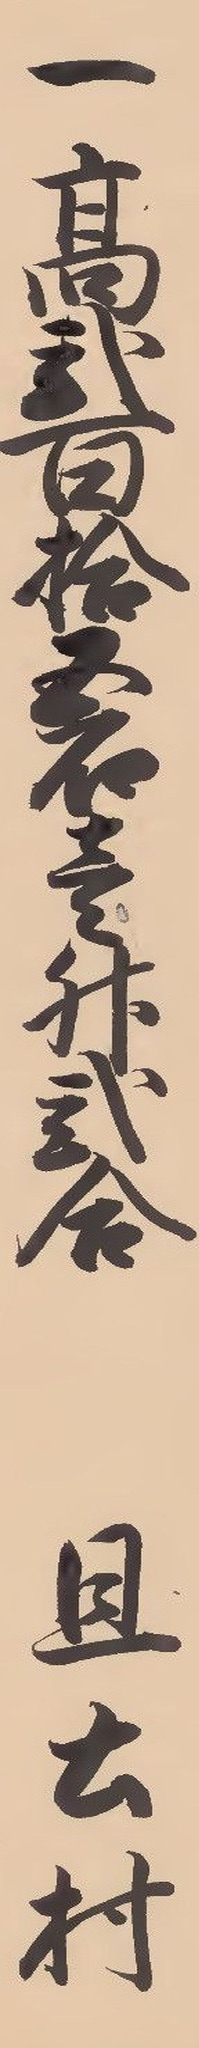一高弐百拾五石壱升弐合旦土村
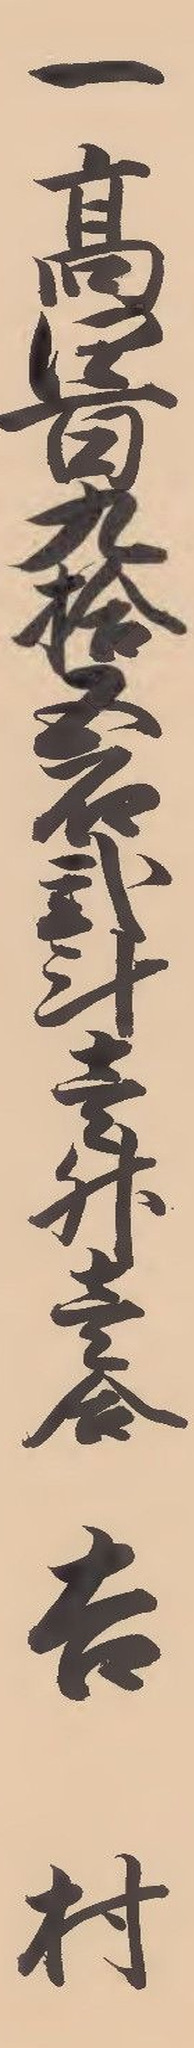一高四百九拾五石弐斗壱升壱合吉村
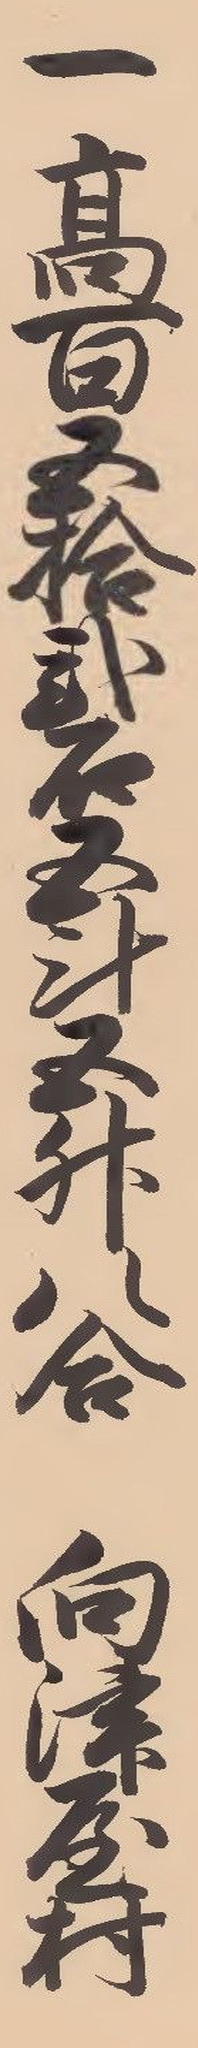一高百五拾弐石五斗五升八合向津屋村
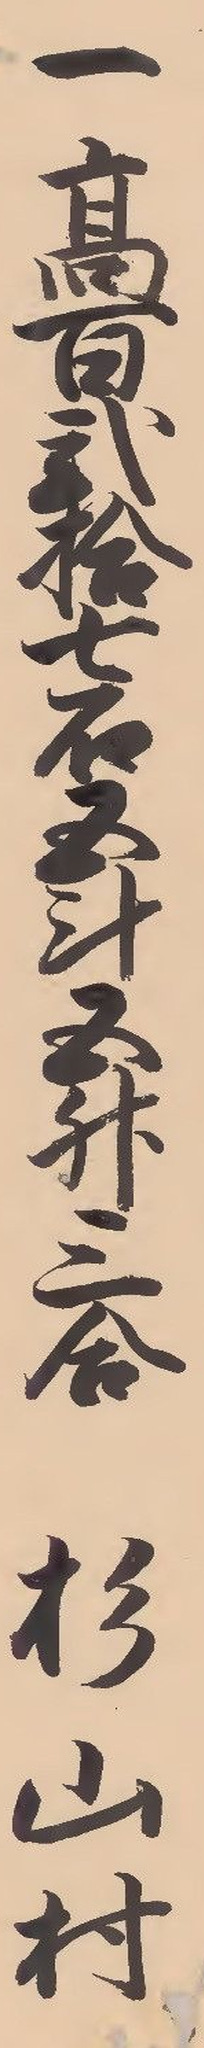一高百弐拾七石五斗五升三合杉山村

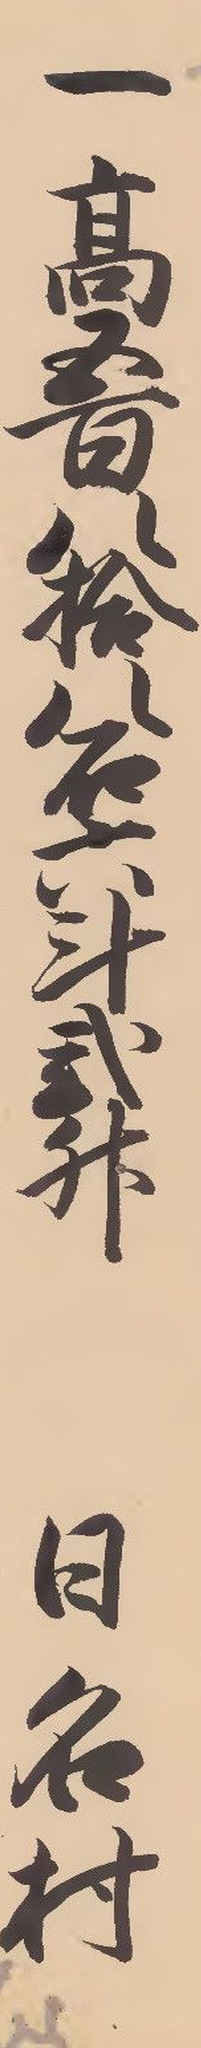一高五百八拾八石六斗弐升日名村
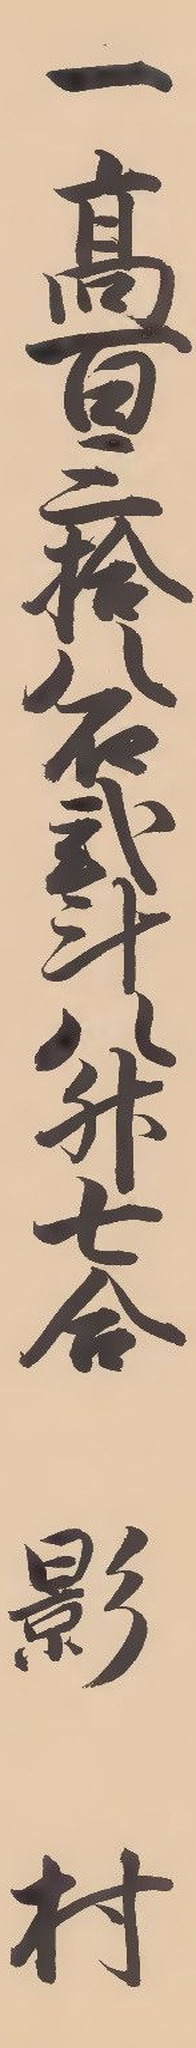一高百三拾八石弐斗八升七合影村
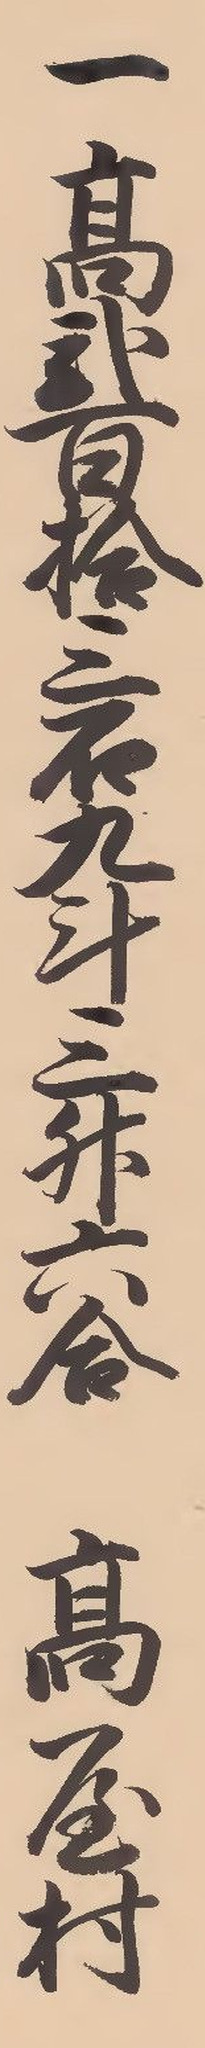一高弐百拾三石九斗三升六合高屋村
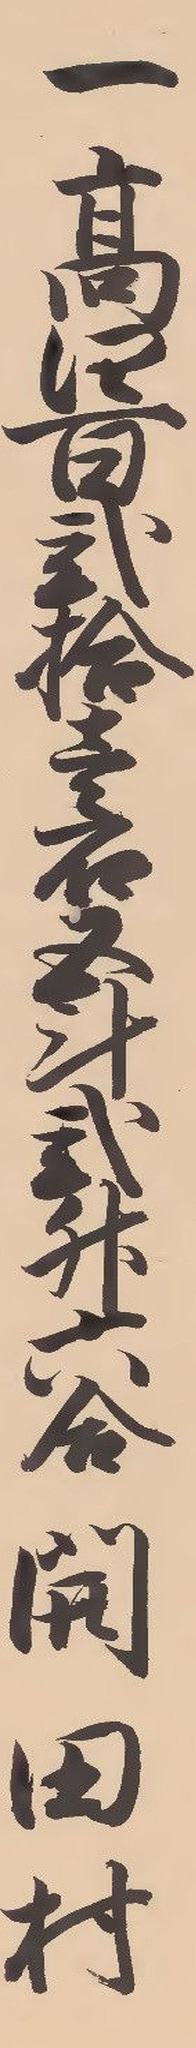一高四百弐拾壱石五斗弐升六合開田村
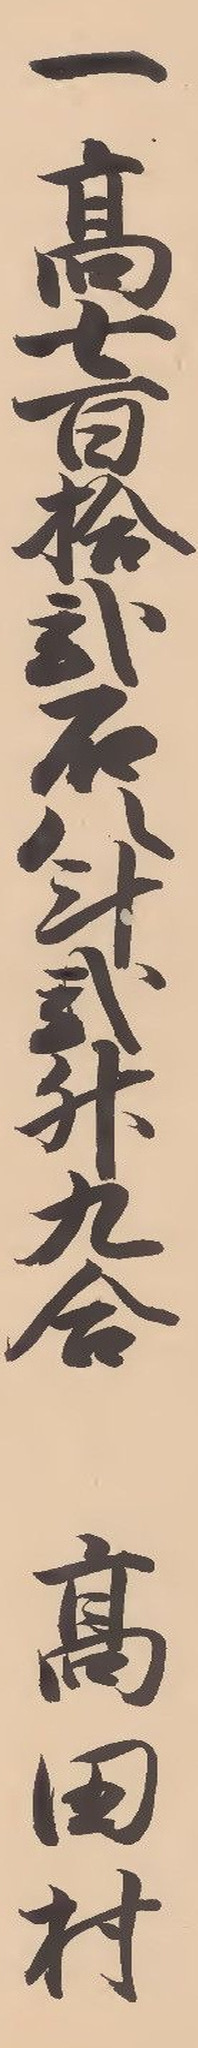一高七百拾弐石八斗弐升九合高田村
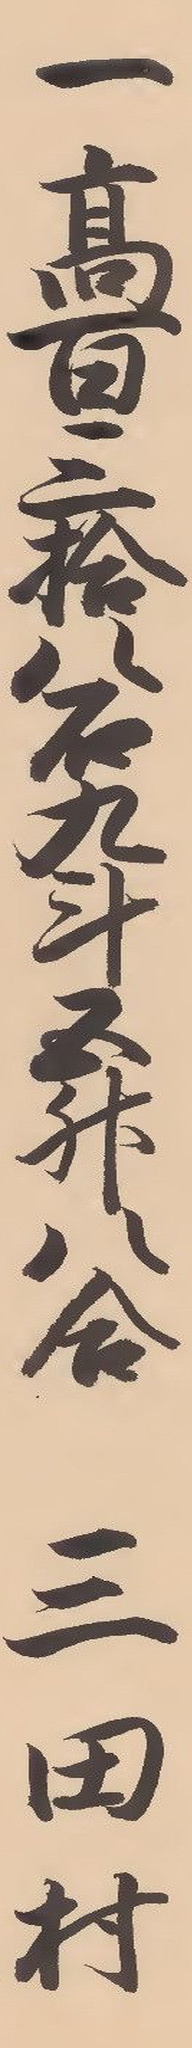一高百三拾八石九斗五升八合三田村
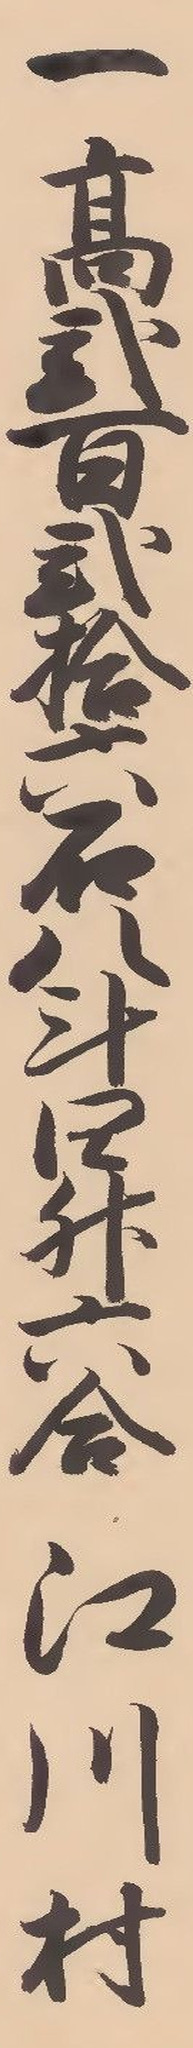一高弐百弐拾六石八斗四升六合江川村
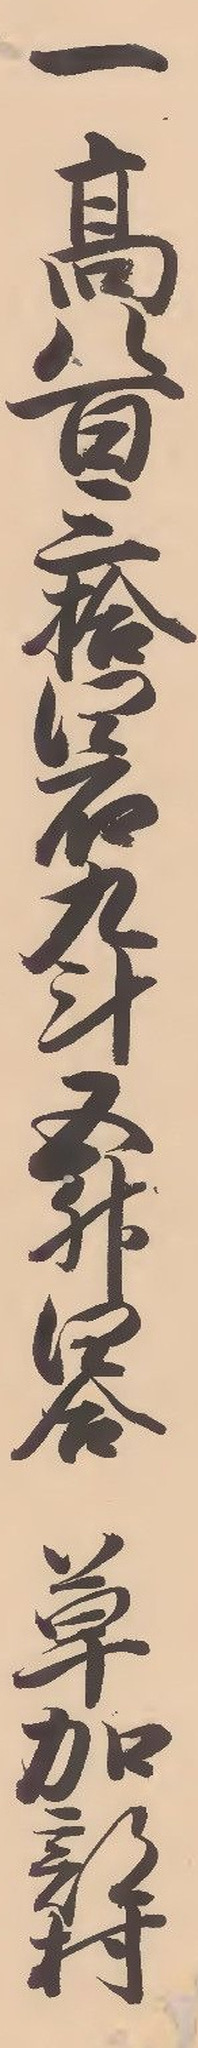一高八百三拾四石九斗五升四合草加部村

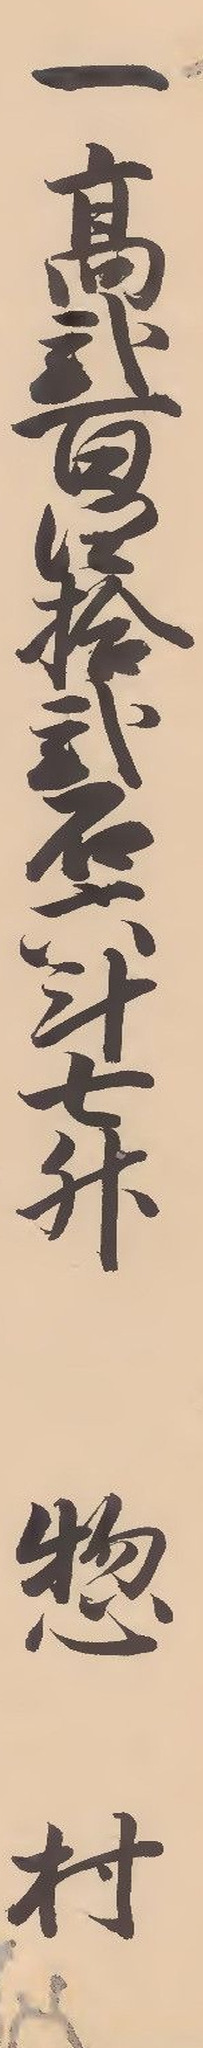一高弐百四拾弐石六斗七升惣村
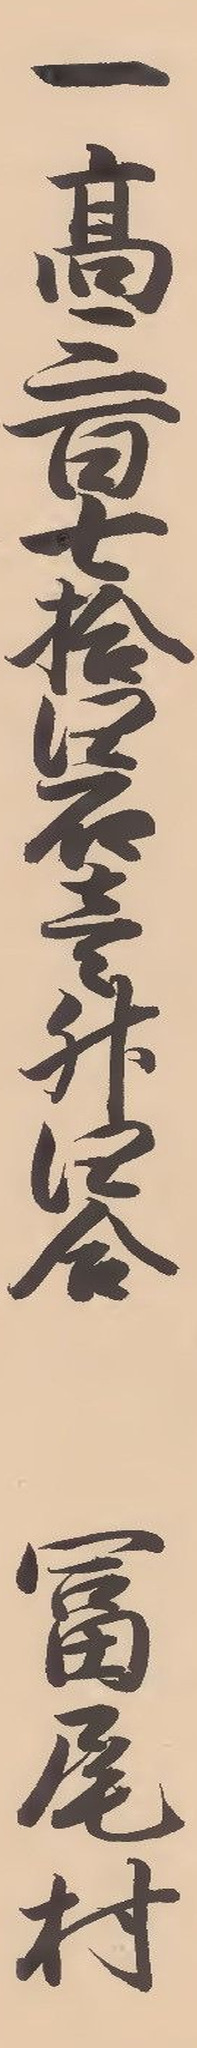一高三百七拾四石壱升四合富尾村
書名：美作国郷帳
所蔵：国立公文書館 National Archives of Japan
